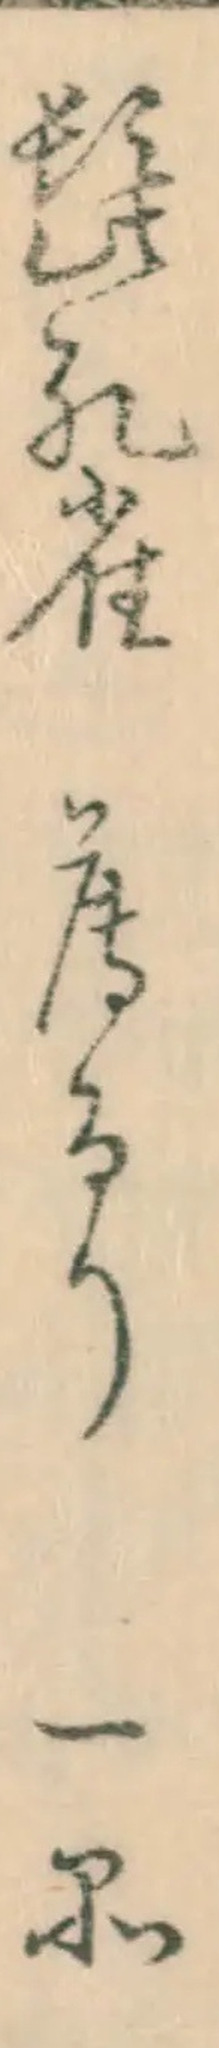髭孔雀薄るり一品
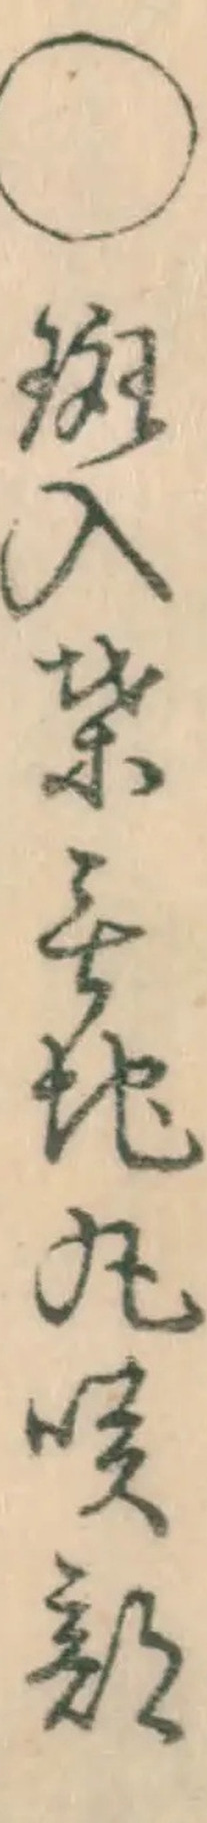○斑入葉無地丸咲部
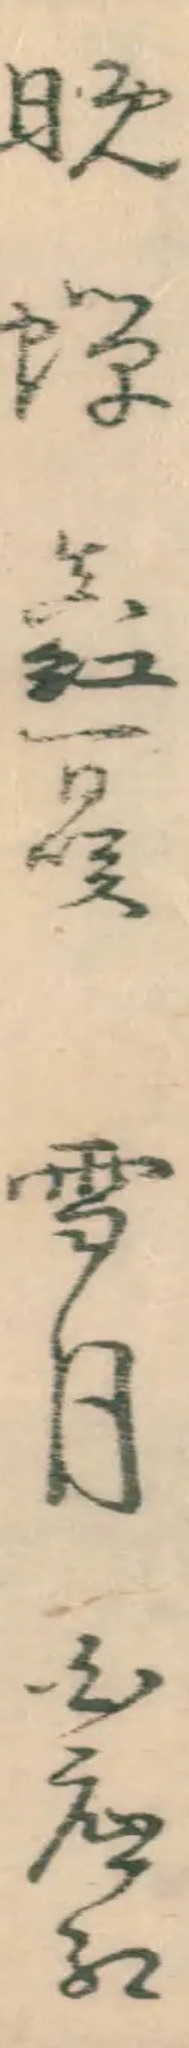晩蝉真紅一日咲雪月花唐紅
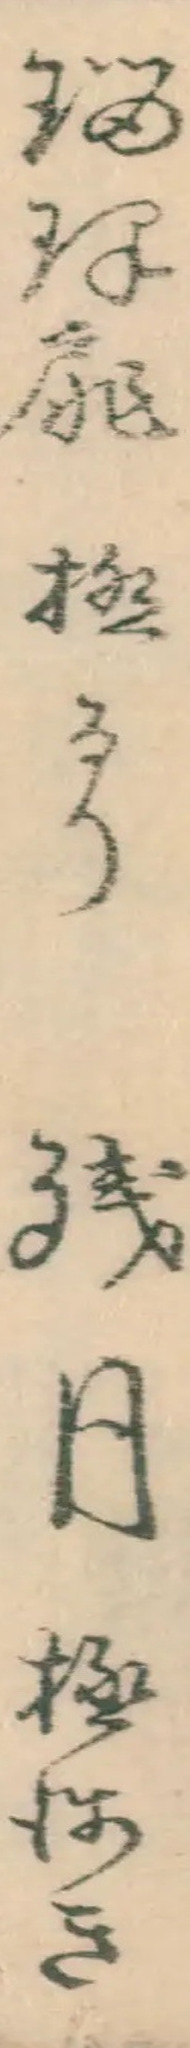瑠璃扉極るり残月極浅き
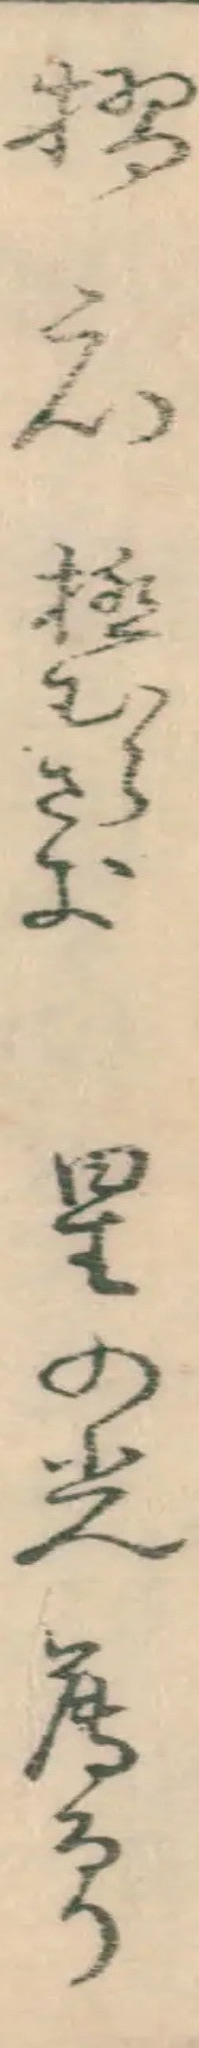摺極むらさき星の光薄るり
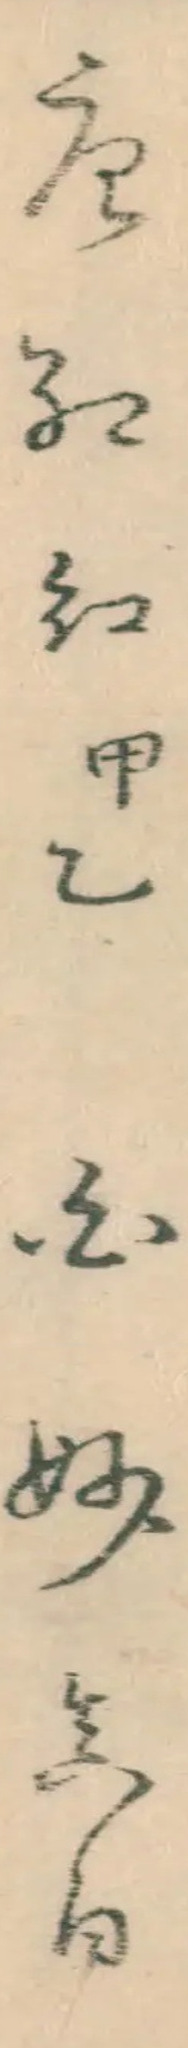唐紅紅甲乙花妙真白
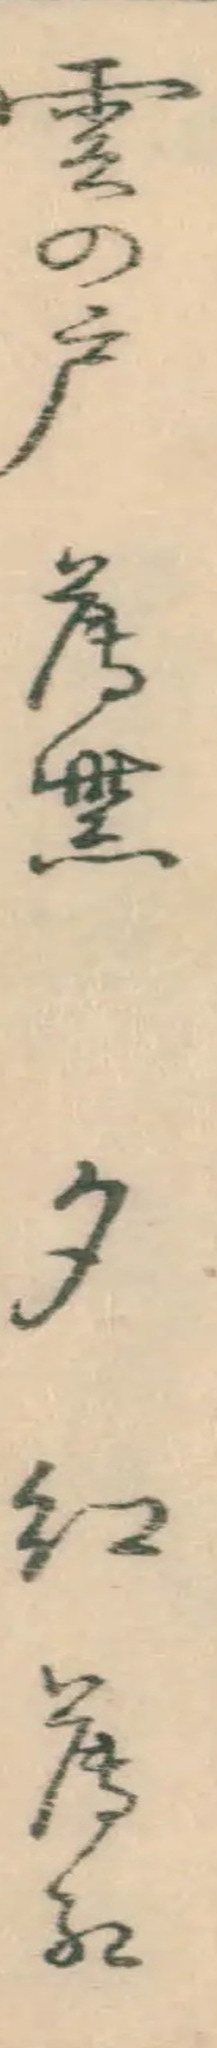雲の戸薄紫夕紅薄紅

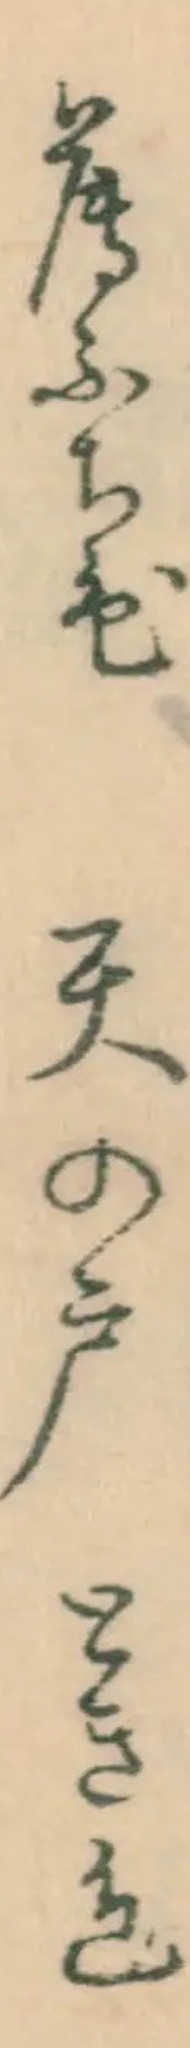幻薄ふち色天の戸とき色
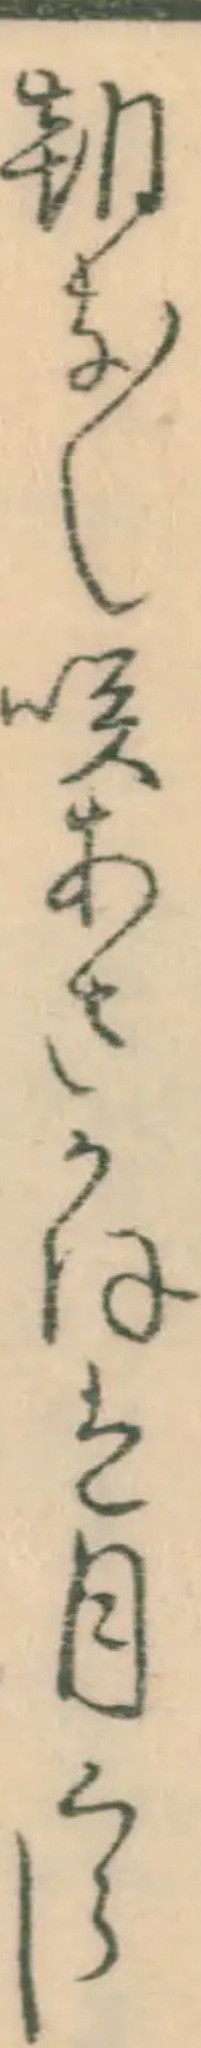朝な〳〵咲あさかほは月くらし
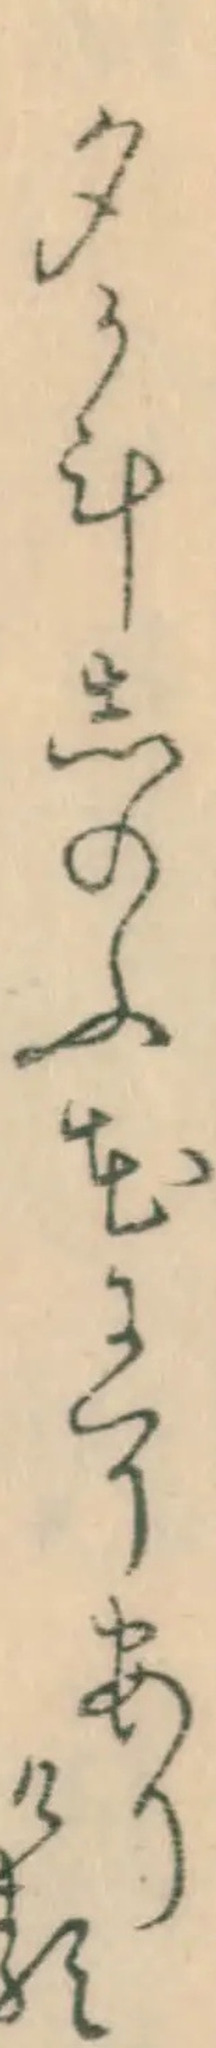夕かとしのふ花にそありける廣海
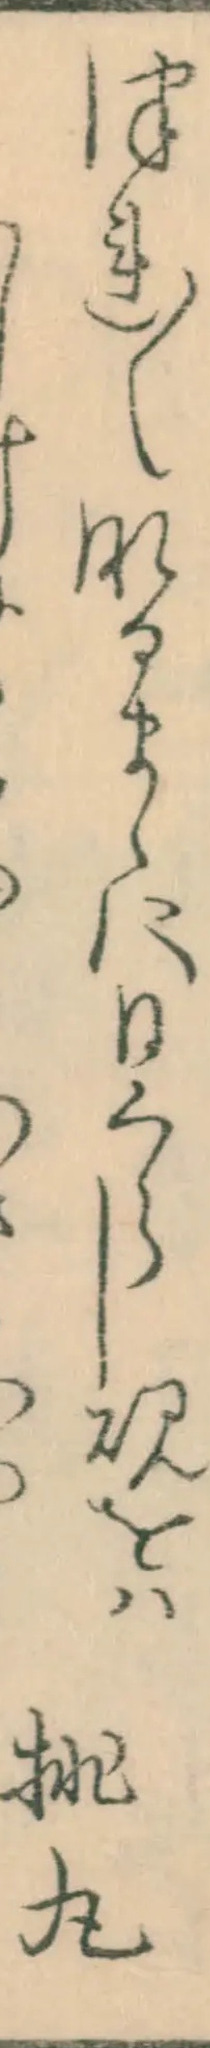つれ〳〵なるまゝに日くらし硯をは
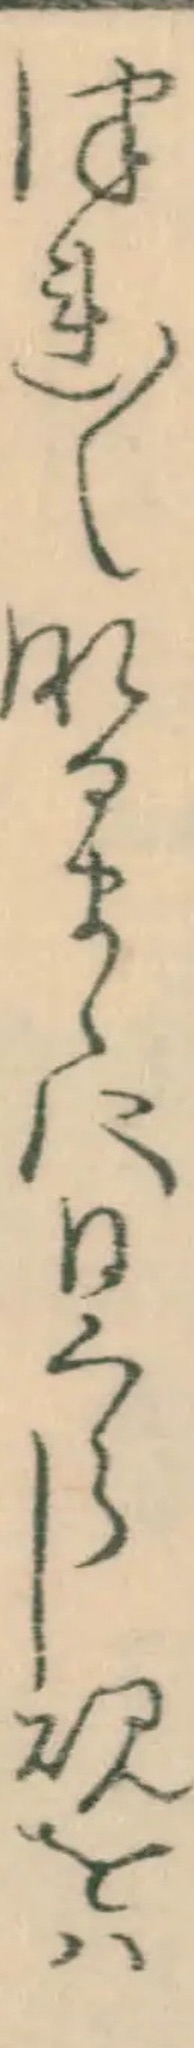つれ〳〵なるまゝに日くらし硯をは
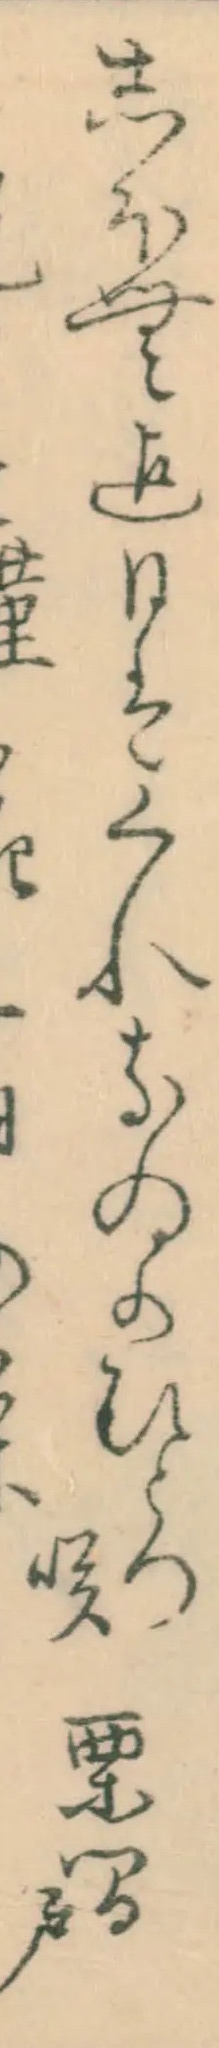しほむ迄日はくれなゐのひとつ咲
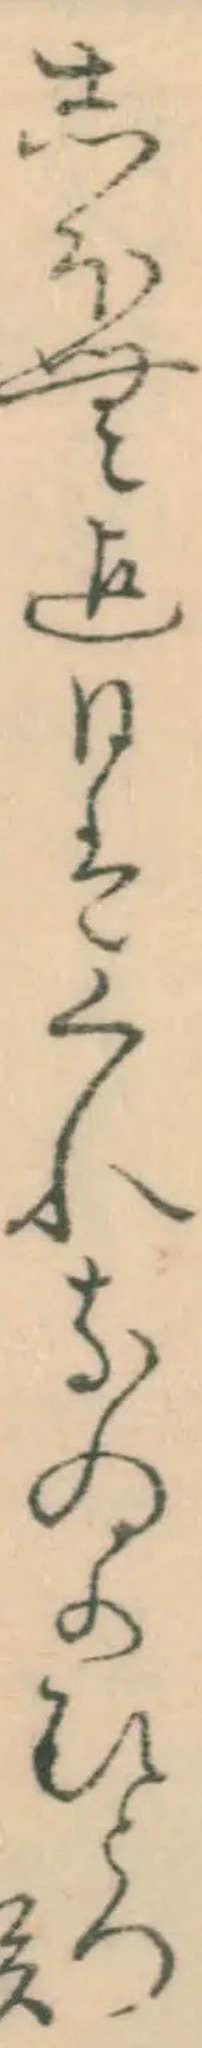しほむ迄日はくれなゐのひとつ咲

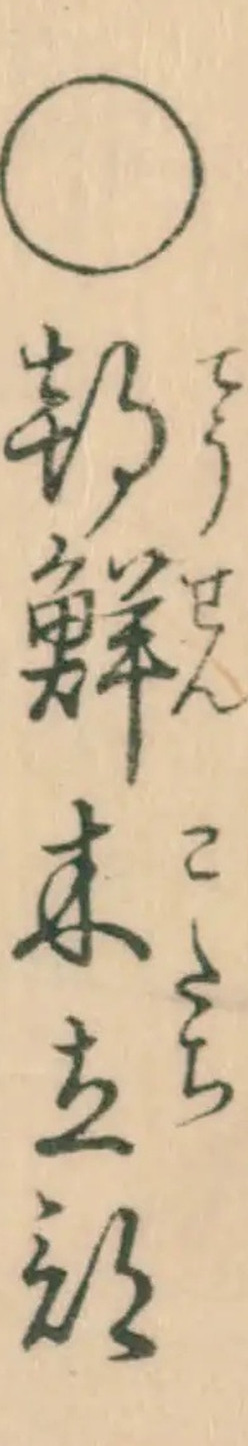○朝鮮木立部
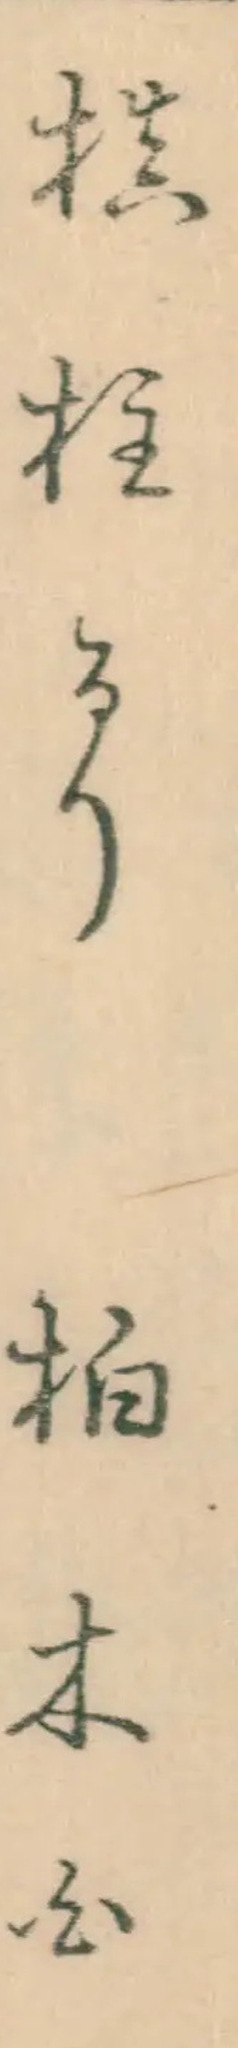槙柱るり柏木花
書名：花壇朝顔通 2巻. [1]
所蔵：国立国会図書館 National Diet Library, JAPAN
